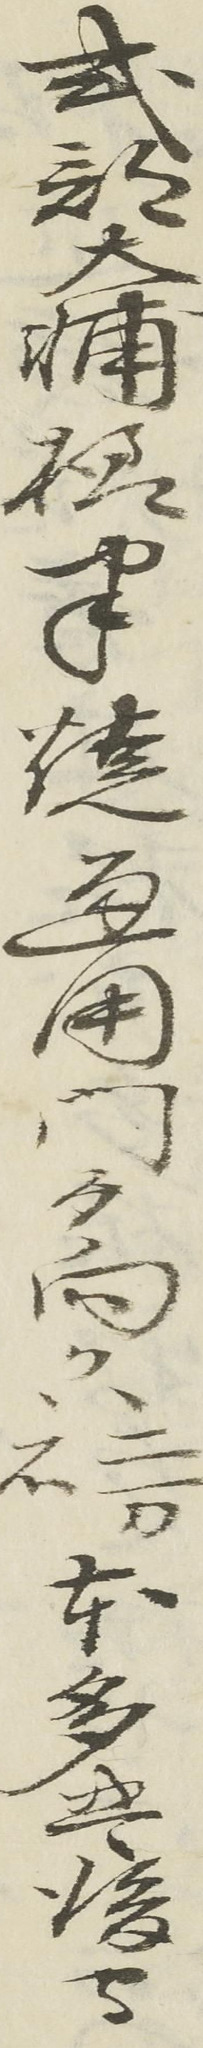式部大輔様半焼通用門ゟ向クハ二万石本多豊後守
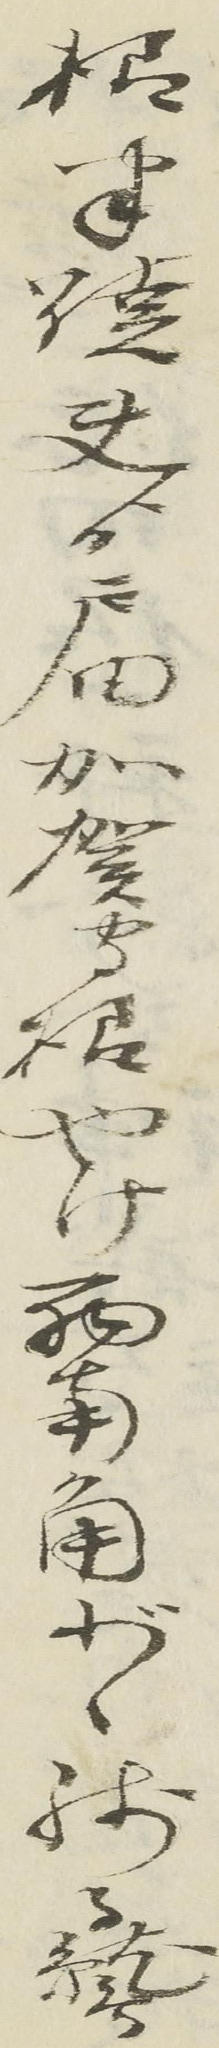様半焼夫ゟ戸田加賀守様やけ西南角ハ少し残る鷲
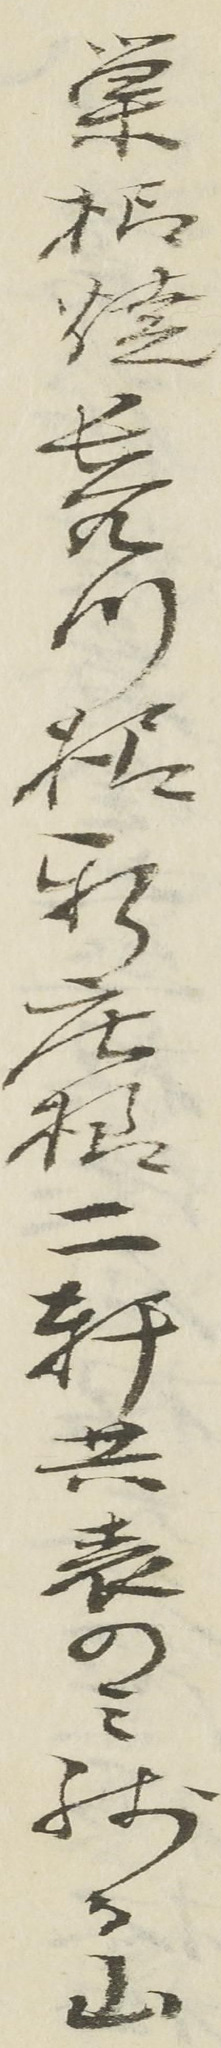巣様焼長谷川様新庄様二軒共表のミ残る山
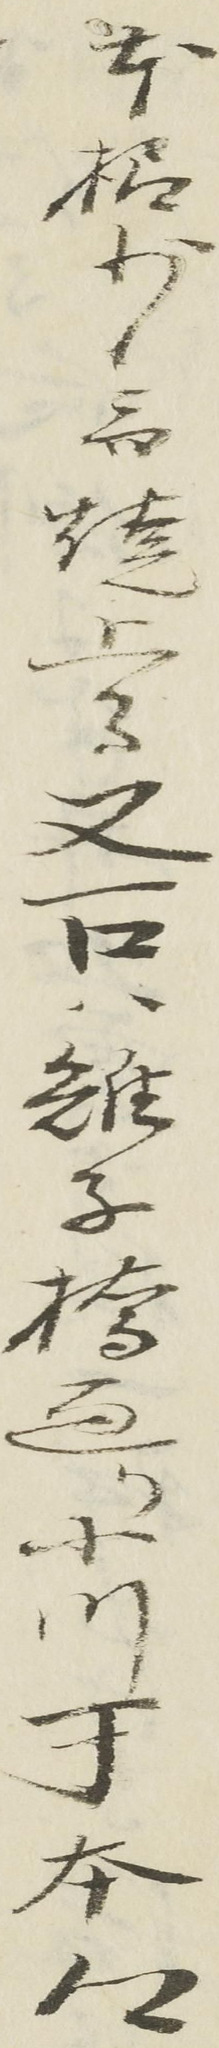本様少しニ而焼上る又一口ハ雉子橋通り小川丁本郷
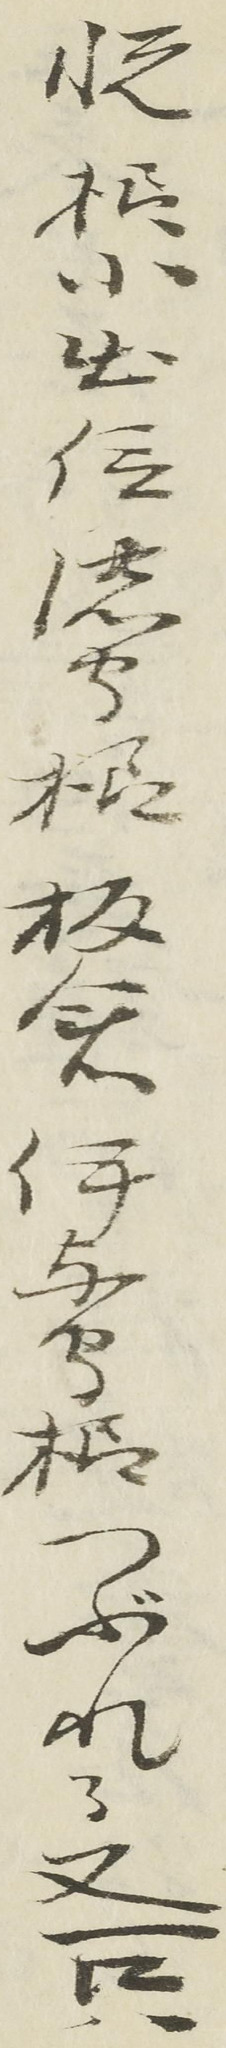悦様小出信濃守様板倉伊予守様つぶれる又一口ハ
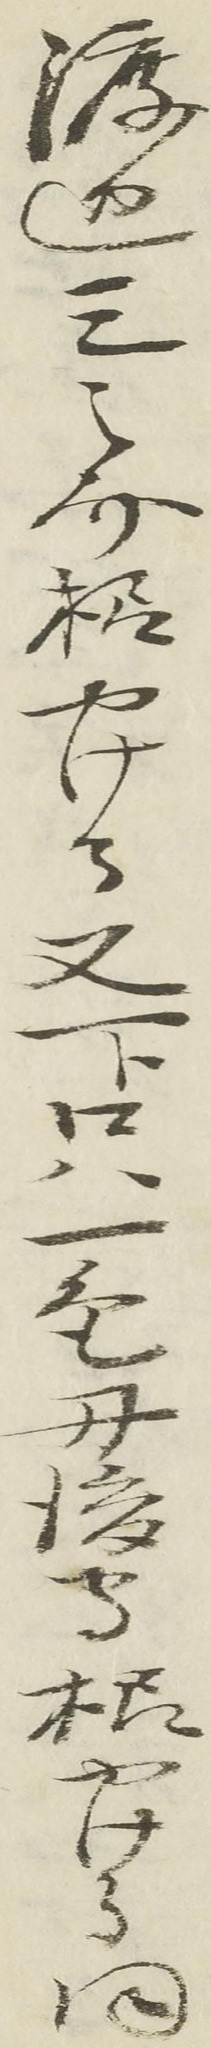渡辺三之介様やける又一ト口ハ一色丹後守様やける同
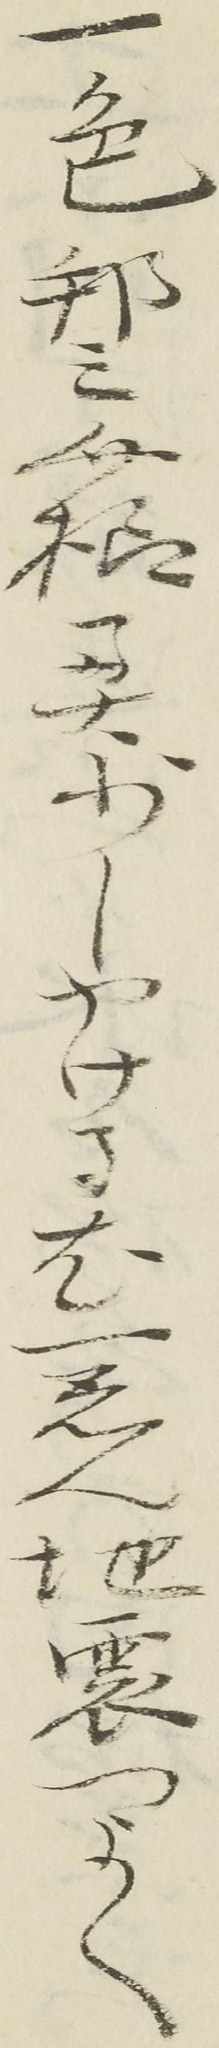一色邦之介様奥少しやける尤一はん地震つよく
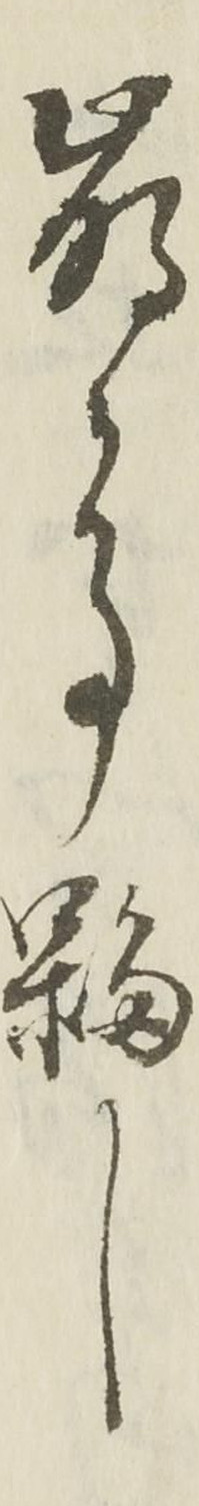崩候事夥し
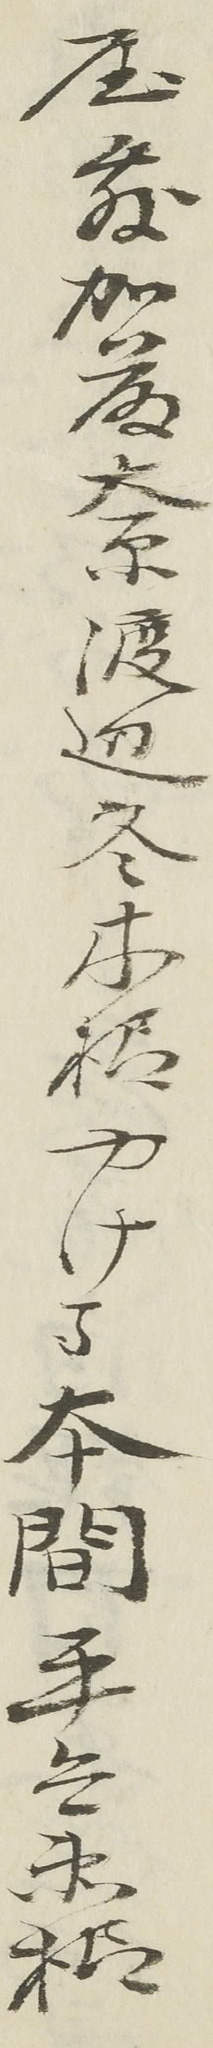屋敷加藤大原渡辺冬木様やける本間平兵衛様
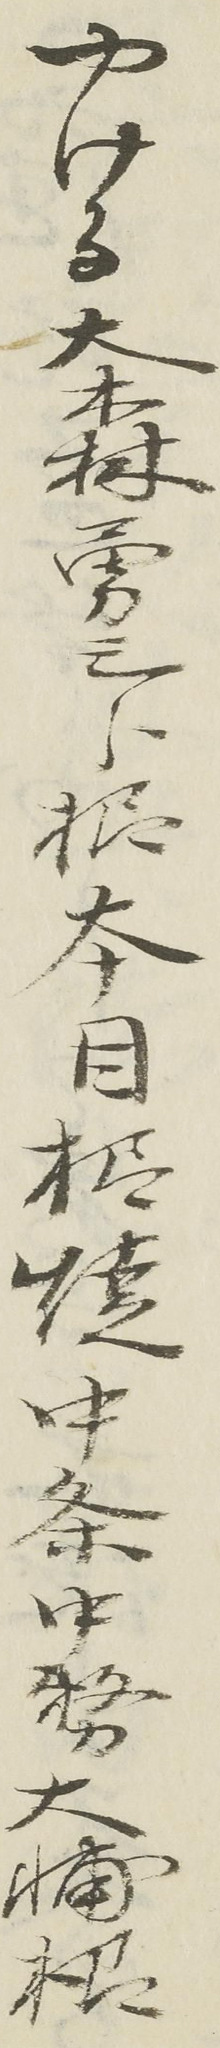やける大森勇三郎様本目様焼中条中務大輔様
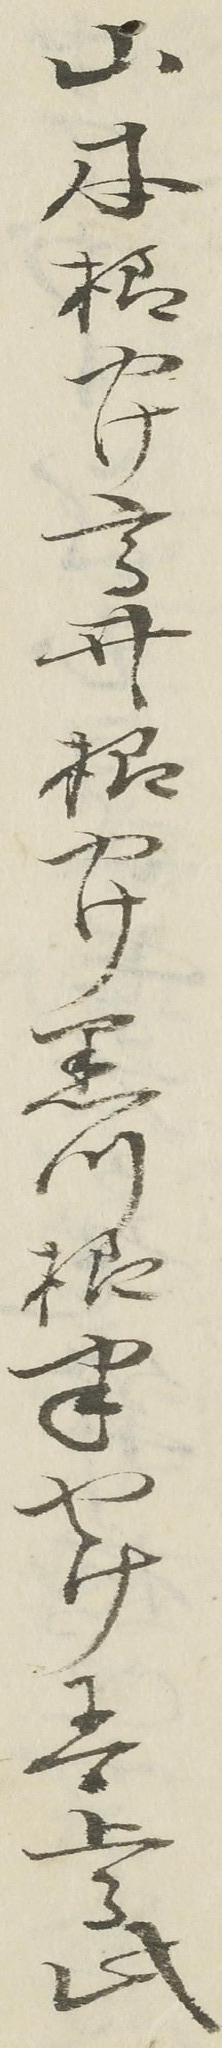山本様やける高井様やけ黒川様半やけにて上る此
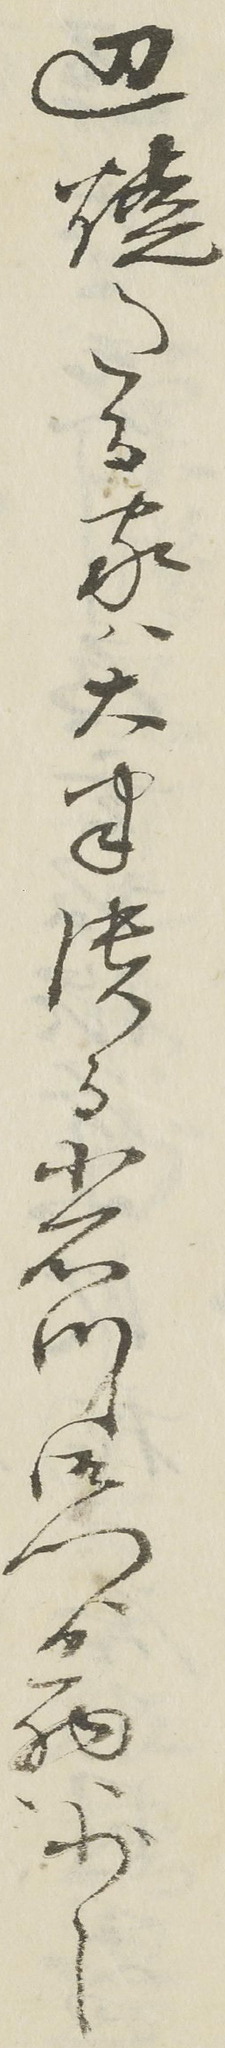辺焼たる家ハ大半潰る小石川御門ゟ西ハ少し
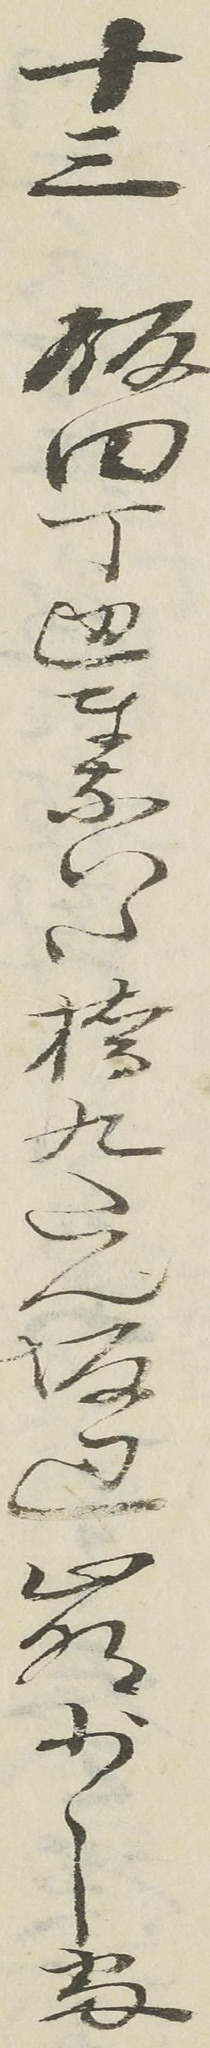十三飯田丁辺まないた橋九たん坂辺崩少し番
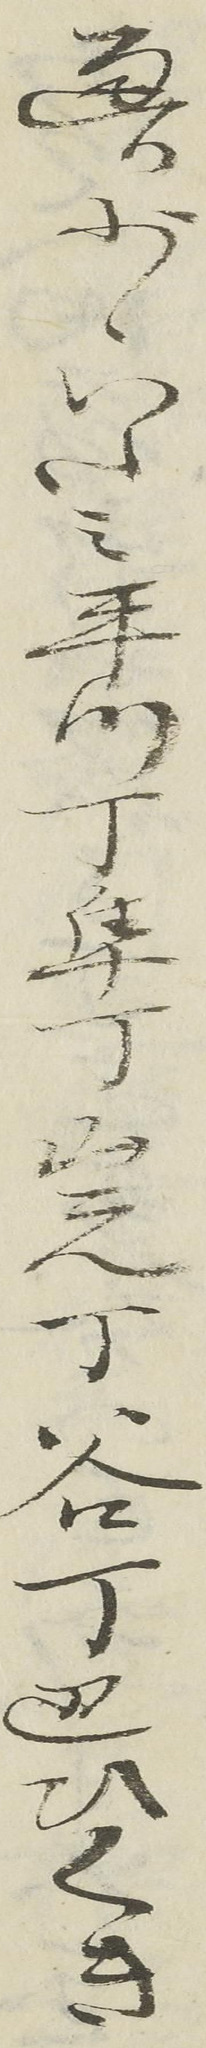通り少しいたミ平川丁隼丁山元丁谷丁辺ひくき
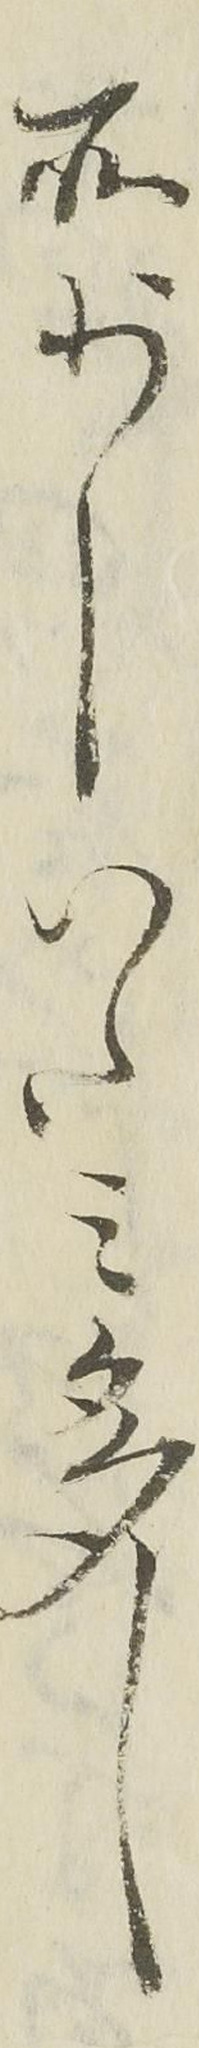所少しいたミ多し

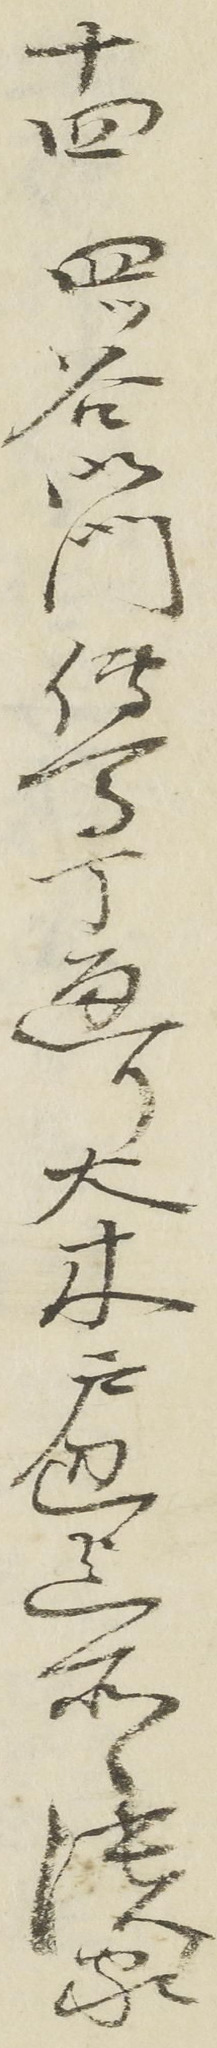十四四ツ谷御門伝馬丁通り大木戸辺迄所々潰家
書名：安政乙卯江戸大地震筆記　安政丙辰八月大阪大雷雨之記追加　安政三辰年七月松前辺大地震并八月大風雨記録
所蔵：東京大学地震研究所図書室 Earthquake Research Institute Library, The University of Tokyo, JAPAN
